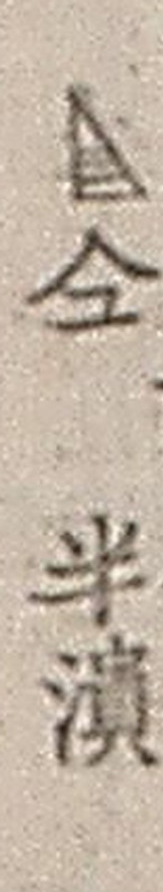仝半潰
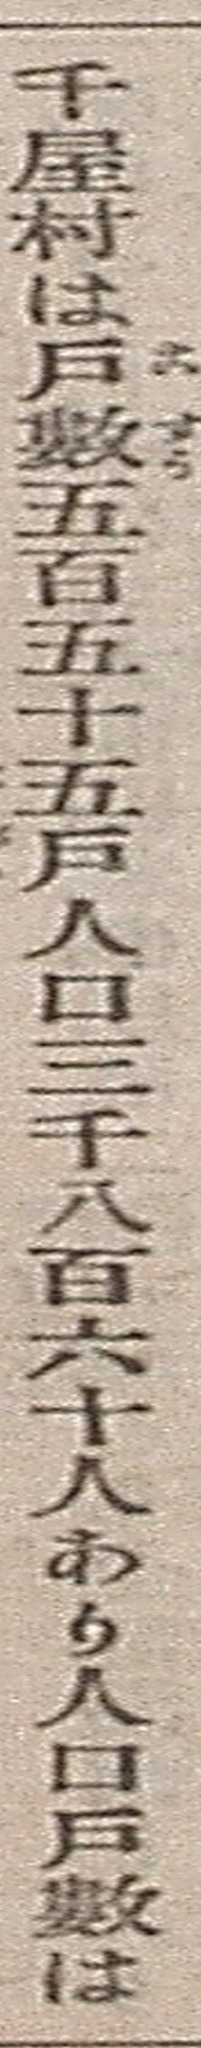千屋村は戸数五百五十五戸人口三千八百六十人あり人口戸数は
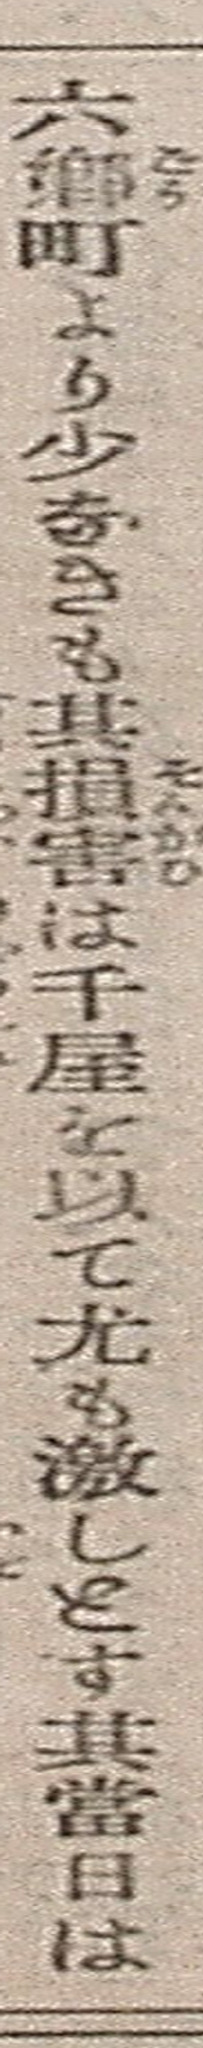六郷町より少なきも其損害は千屋を以て尤も激しとす其当日は
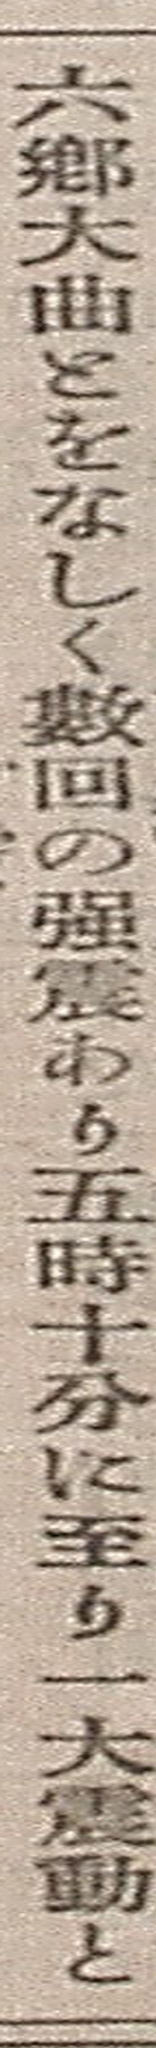六郷大曲とをなしく数回の強震あり五時十分に至り一大震動と
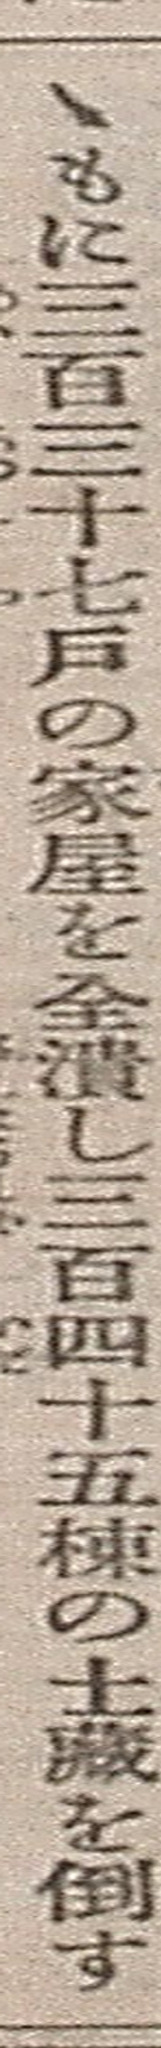ゝもに三百三十七戸の家屋を全潰し三百四十五棟の土蔵を倒す
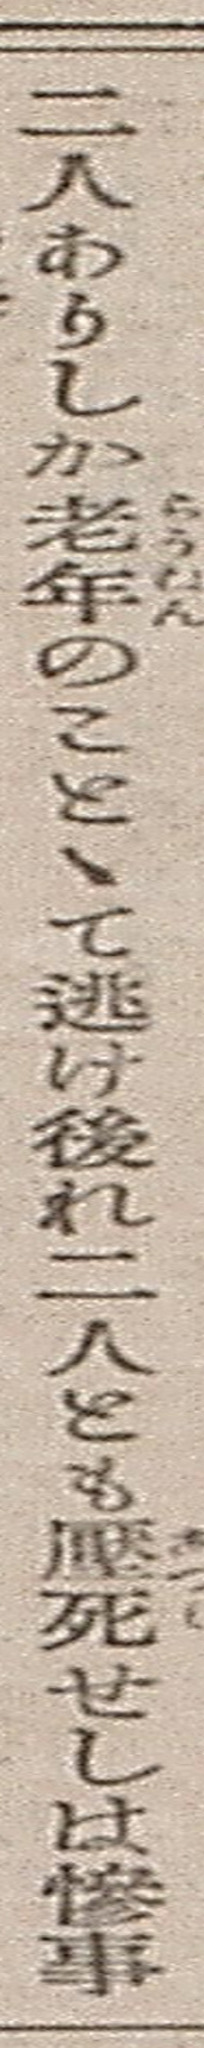二人ありしか老年のことゝて逃け後れ二人とも圧死せしは惨事
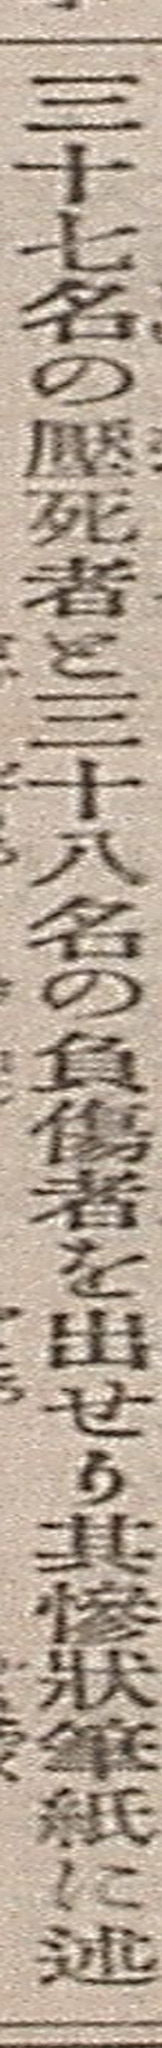三十七名の圧死者と三十八名の負傷者を出せり其惨状筆紙に述
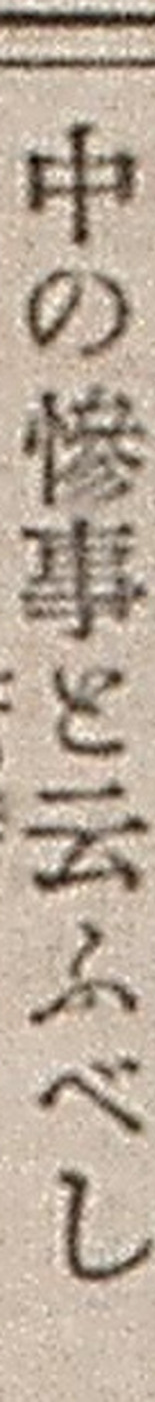中の惨事と云ふべし
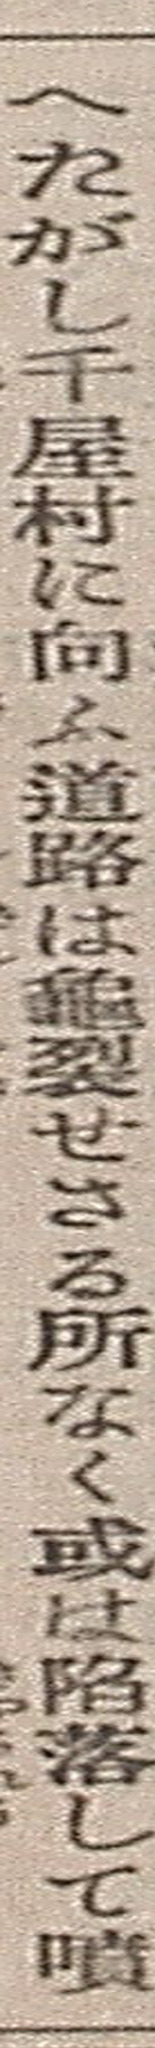へたがし千屋村に向ふ道路は亀裂せさる所なく或は陥落して噴
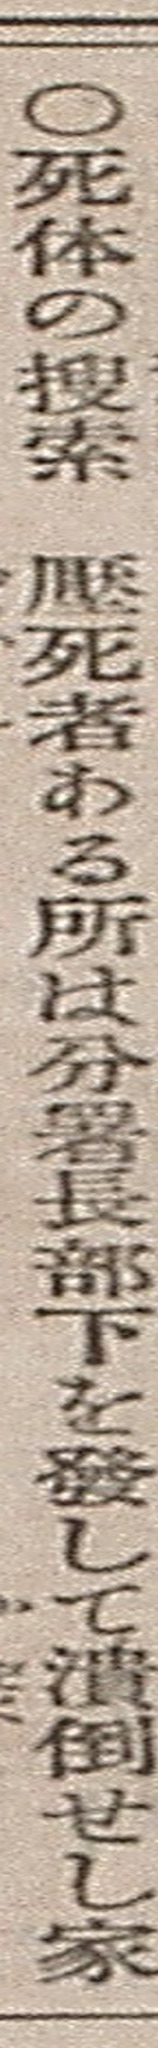〇死体の捜索圧死者ある所は分署長部課を発して潰倒せし家
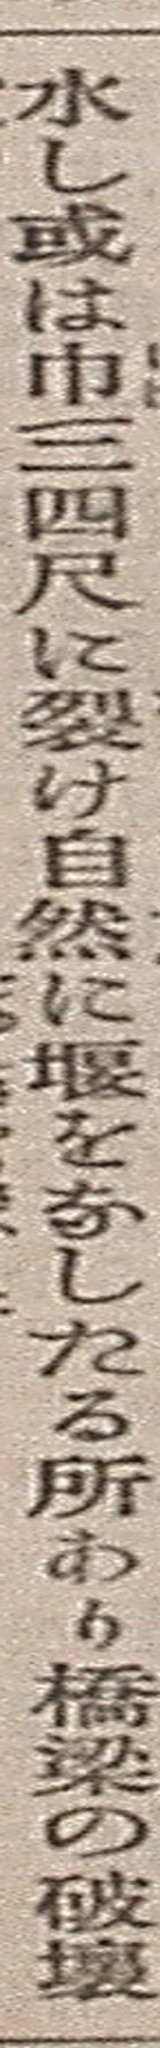水し或は巾三四尺に裂け自然に堰をなしたる所あり橋梁の破壊
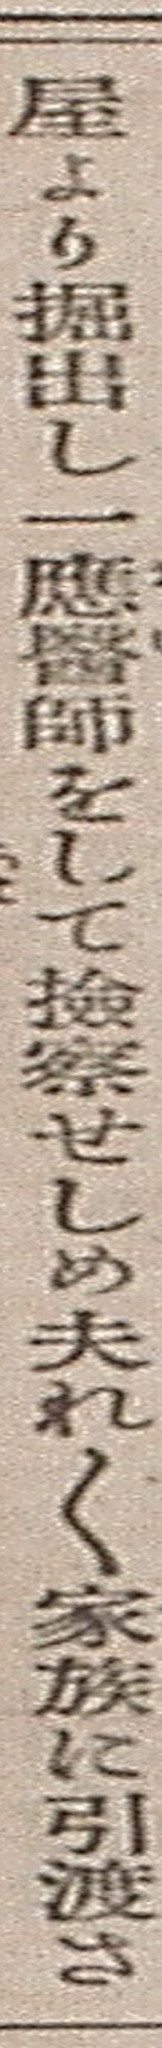屋より掘出し一応医師をして検察せしめ夫れ〳〵家族に引渡さ
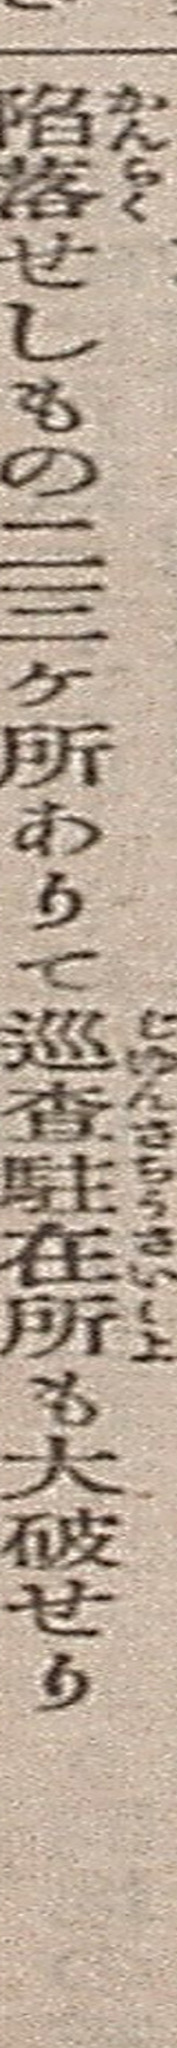陥落せしもの二三ケ所ありて巡査駐在所も大破せり
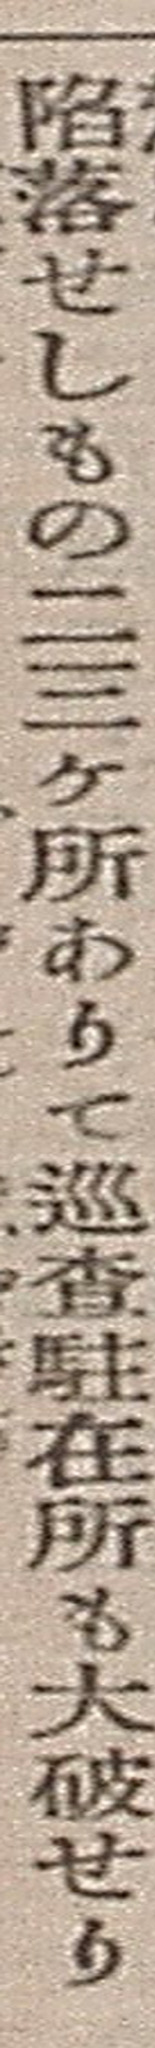陥落せしもの二三ケ所ありて巡査駐在所も大破せり
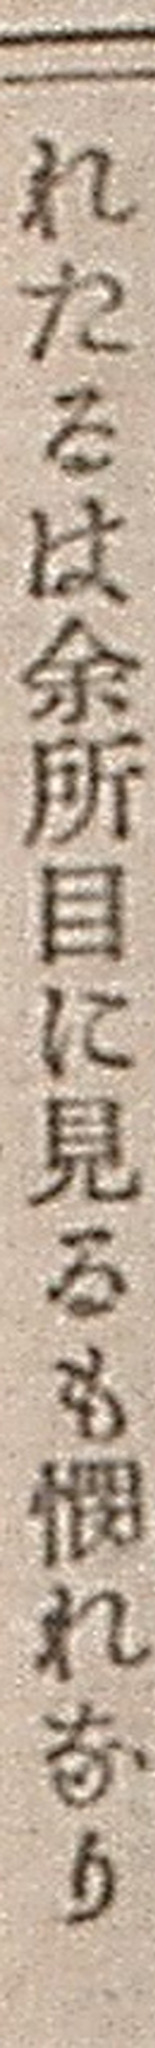れたるは余所目に見るも憐れなり
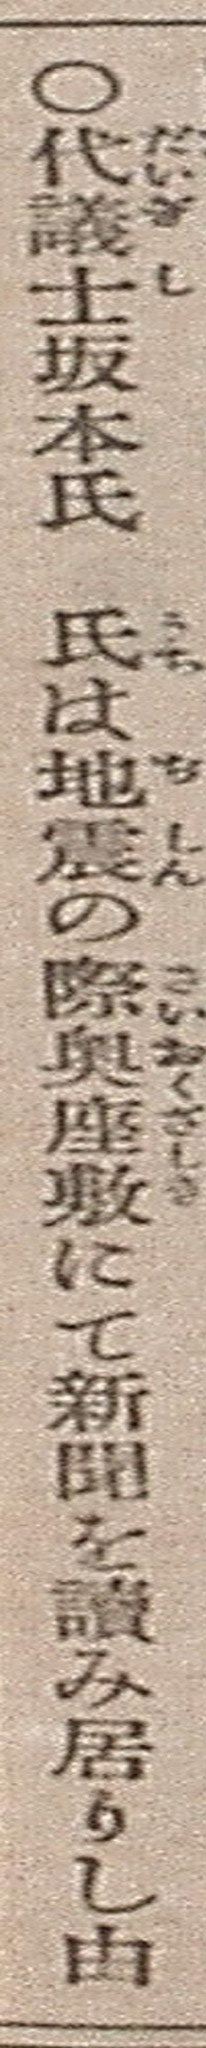〇代議士坂本氏氏は地震の際奥座敷にて新聞を読み居りし由
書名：風俗畫報臨時増刊第百二十四號　洪水地震被害録（上）
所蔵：東京大学地震研究所図書室 Earthquake Research Institute Library, The University of Tokyo, JAPAN
